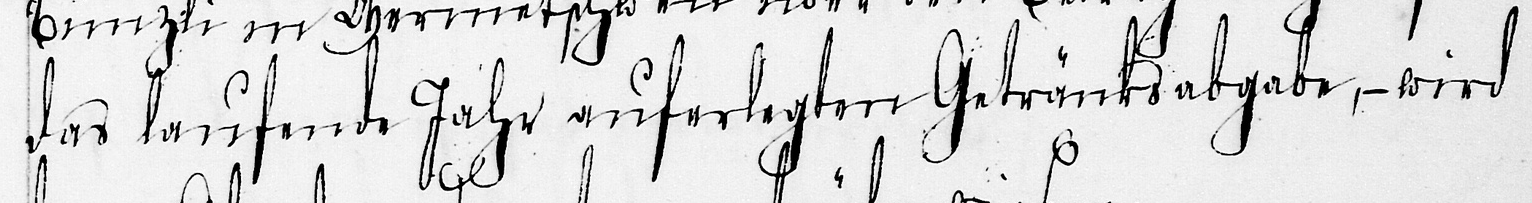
das laufende Jahr auferlegten Getränksabgabe, – wird
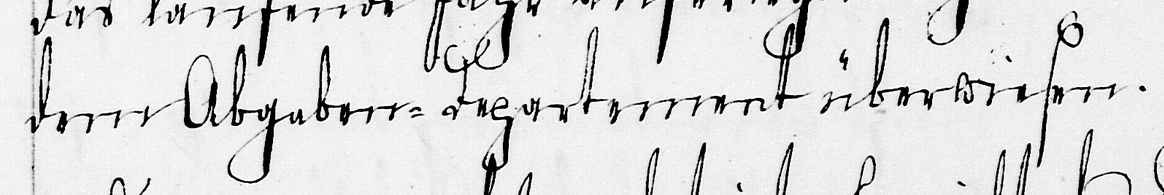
dem Abgaben-Departement überwiesen.
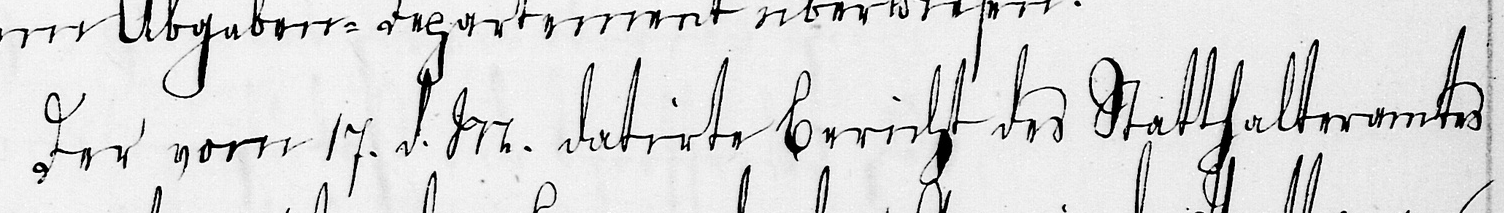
Der vom 17. d. M. datirte Bericht des Statthalteramtes
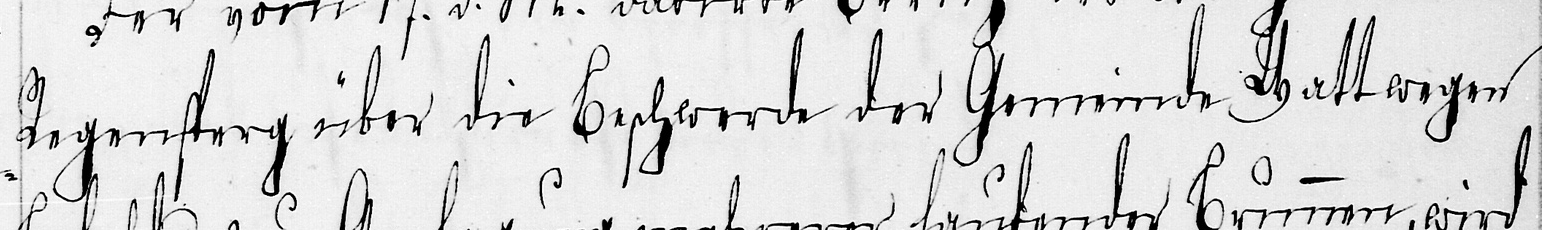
Regensperg über die Beschwerde der Gemeinde Watt wegen
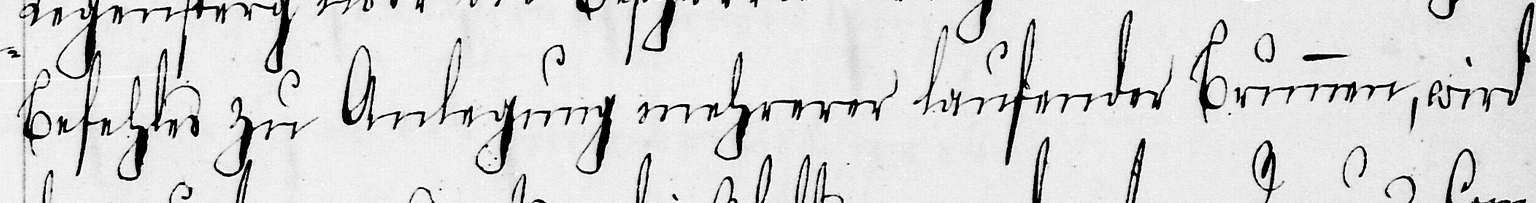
Befehles zu Anlegung mehrerer laufender Brunnen, wird
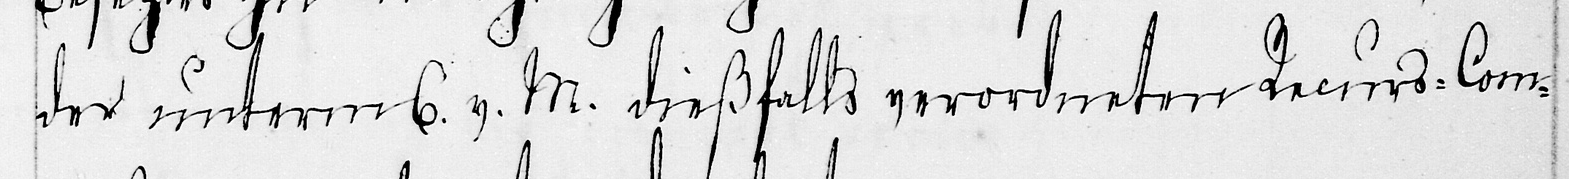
der unterm 6. v. M. dießfalls verordneten Recurs-Co¬
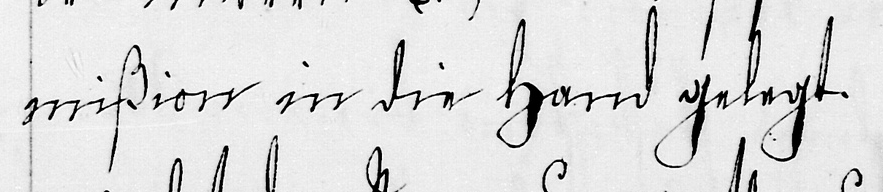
mißion in die Hand gelegt.
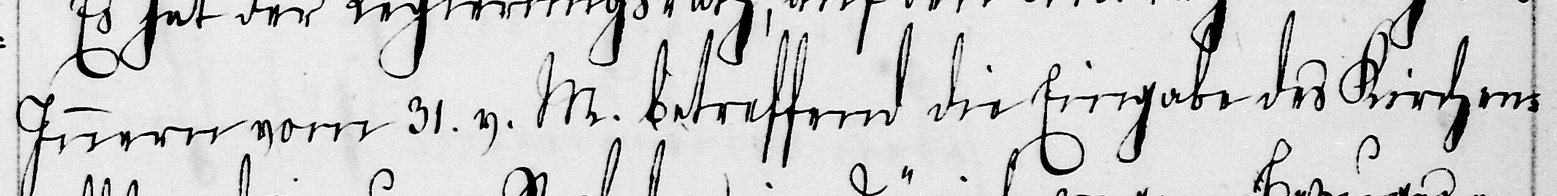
Innern vom 31. v. M. betreffend die Eingabe des Kirchen¬
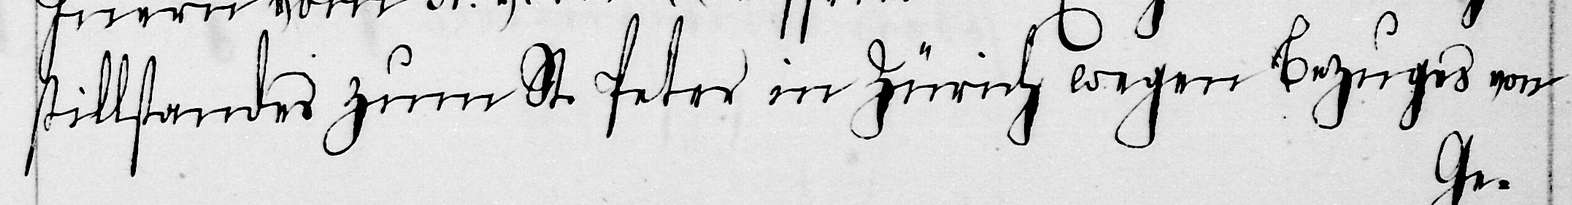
stillstandes zum St. Peter in Zürich wegen Bezuges von
